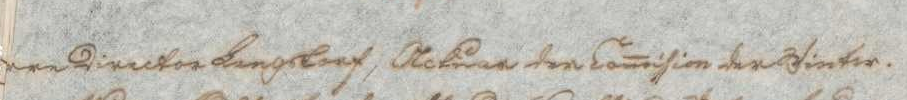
Herr Director Lengstorf, Actuar der Commission der Winter-
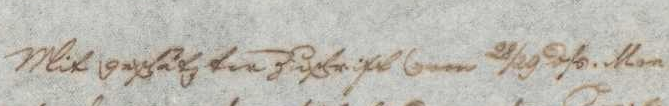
Mit geschätzter Zuschrift vom 28/29 dss. Mon.
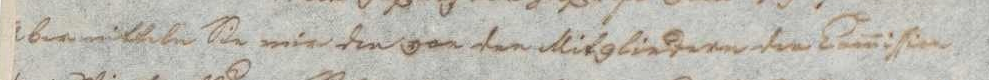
übermitteln Sie mir die von den Mitgliedern der Commission
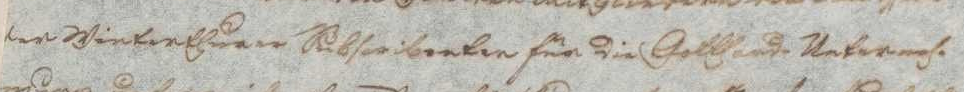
der Winterthurer Subscribenten für die Gotthard-Unterneh-
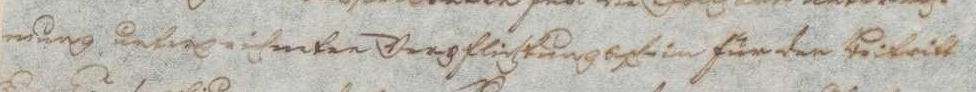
mung unterzeichneten Verpflichtungsscheine für den Beitritt
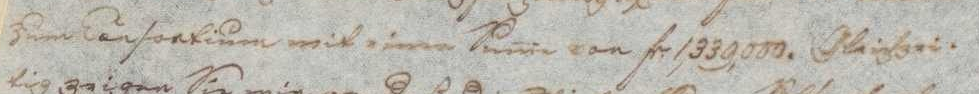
zum Consortium mit einer Summe von Fr. 1,330,000. Gleichzei-
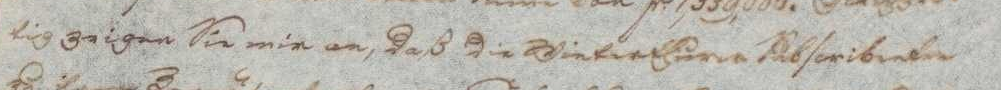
tig zeigen Sie mir an, daß die Winterthurer Subscribenten
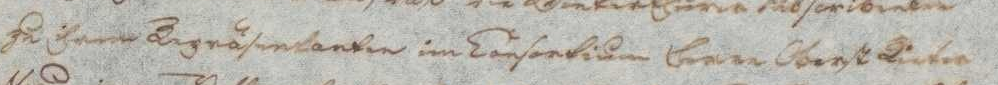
zu ihren Repräsentanten im Consortium Herrn Oberst Rieter
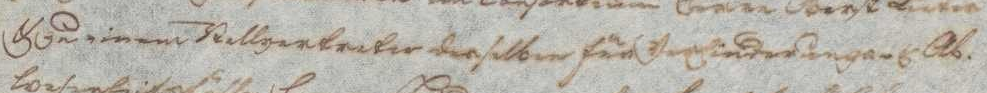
& zu einem Stellvertreter desselben für Verhinderungs- & Ab-
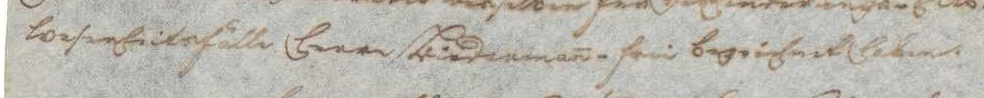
wesenheitsfälle Herr Biedermann-Frei bezeichnet haben.
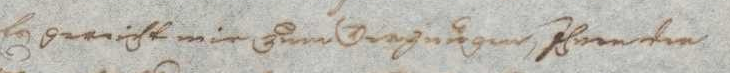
Es gereicht mir zum Vergnügen, Ihnen den
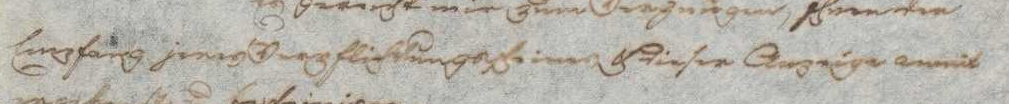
Empfang jenes Verpflichtungsscheines & dieser Anzeige anmit
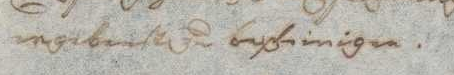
ergebenst zu bescheinigen.
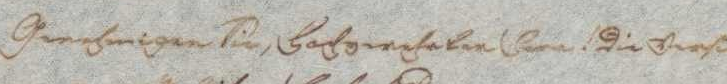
Genehmigen Sie, hochgeehrter Herr! Die Versi-
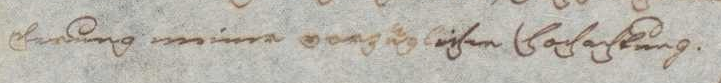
cherung meiner vorzüglichen Hochachtung.
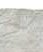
1869.
